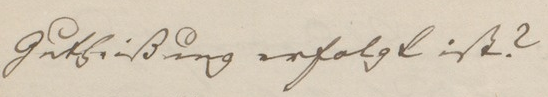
Gutheißung erfolgt ist?
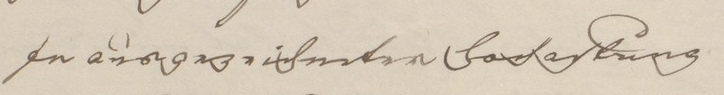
In ausgezeichneter Hochachtung
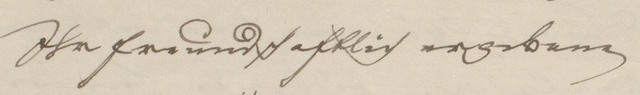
Ihr freundschaftlich ergebene
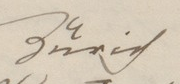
Zürich
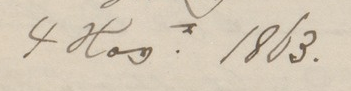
4 Novr 1863.
